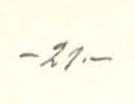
21.
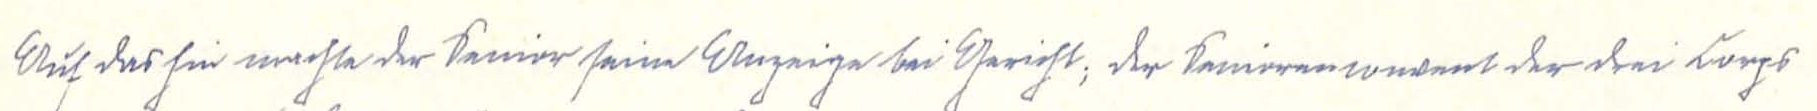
Auf das hin machte der Senior seine Anzeige bei Gericht; dem Seniorenconvent der drei Corps
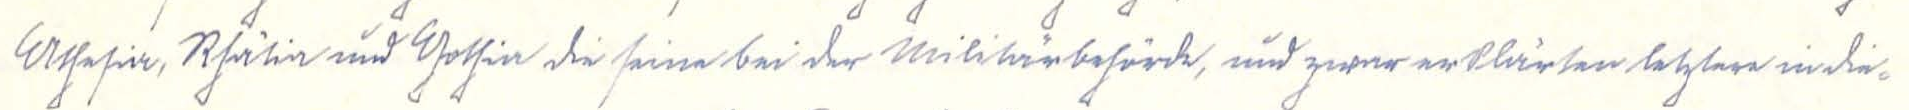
Athesia, Rhätia und Gothia die seine bei der Militärbehörde, und zuvor erklärte letztere in die-
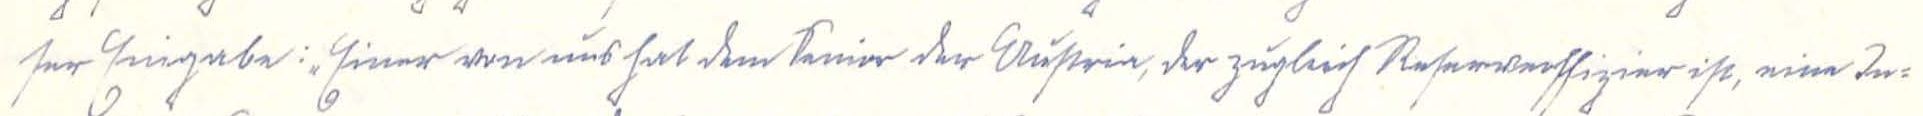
ser Eingabe; Einer von uns hat dem Senior der Austria der zugleich Reserveoffizier ist, eine In-
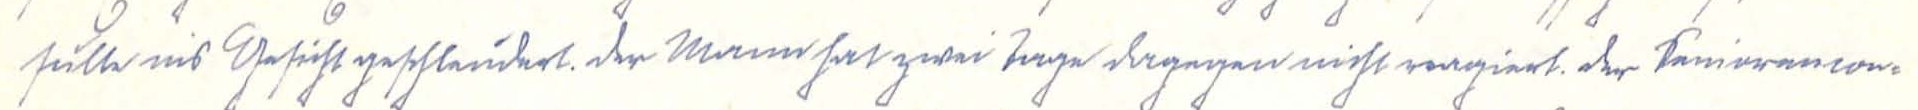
sulte ins Gesicht geschleudert. Der Mann hat zwei Tage dagegen nicht reagiert. Der Seniorenvon-
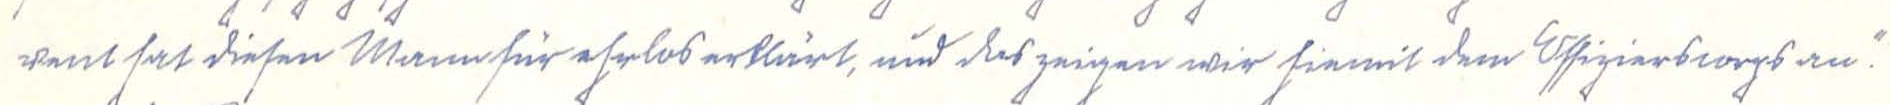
vent hat diesen Mann für ehrlos erklärt, und das zeigen wir hiermit dem Offizierscorps an".
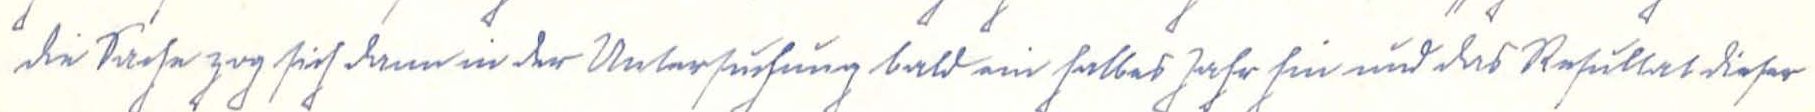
Die Sache zog sich dann in der Untersuchung bald ein halbes Jahr hin und das Resultat dieser
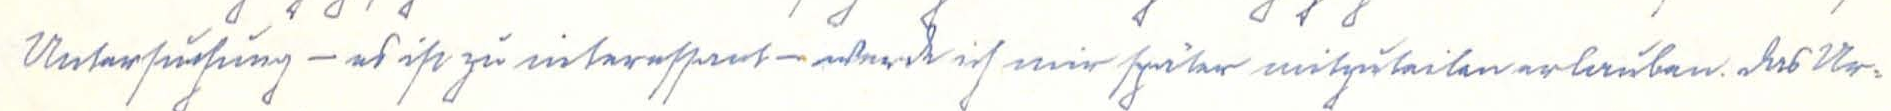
Untersuchung - es ist zu interessant - werde ich mir später mitzuteilen erlauben. Das Ur-
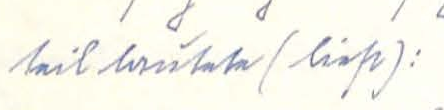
teil lautete (liest):
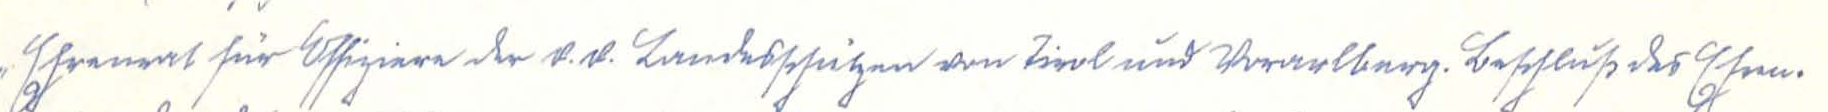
Ehrenrat für Offiziere der k.k. Landesschützen von Tirol und Vorarlberg, Beschluss des Ehren-
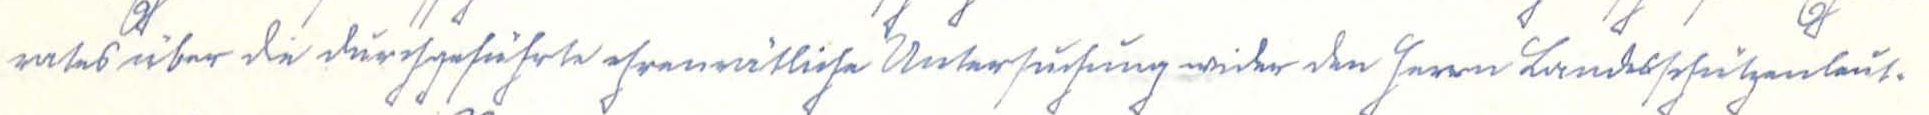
rates übes die durchgeführte ehrenrätliche Untersuchung wieder den Herrn Landesschützenleut-
